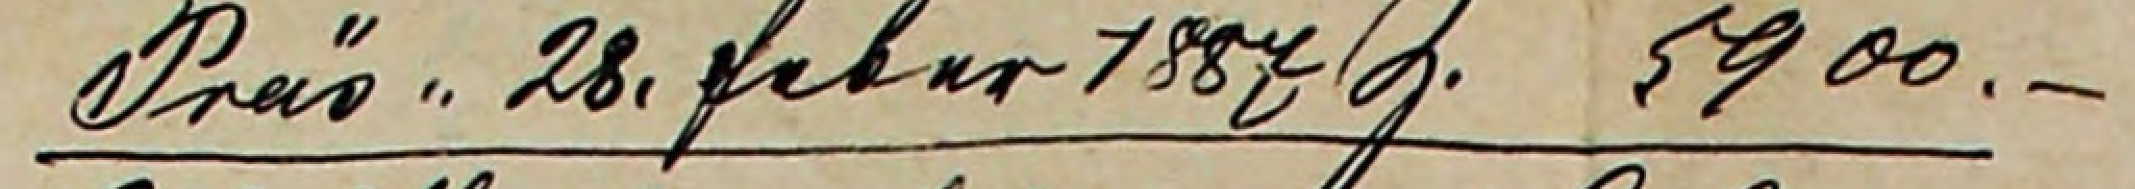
Präs. 28, Feber 1887 Y. 59 00.—
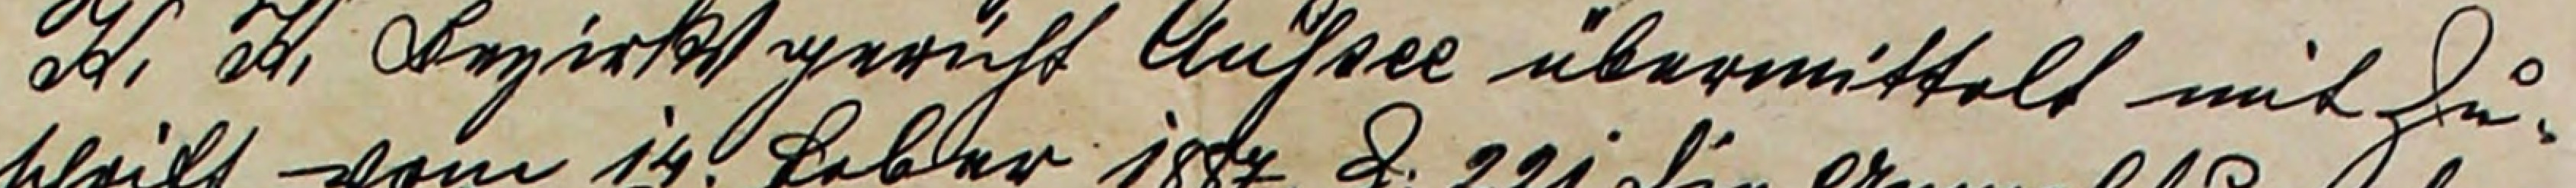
K. K. Bezirkt gericht Aussee übermittelt mit Zu„
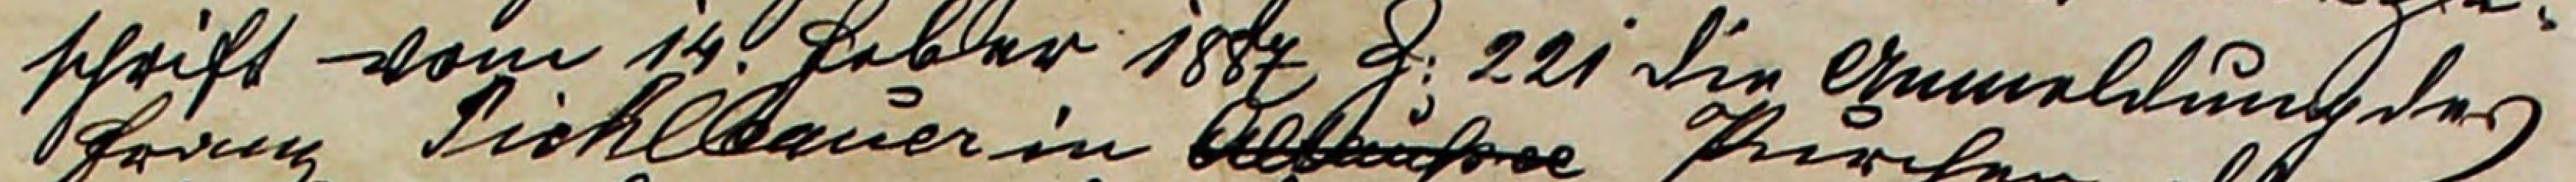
schrift vom 14. Feber 1887 Z: 221 die Anmeldung des
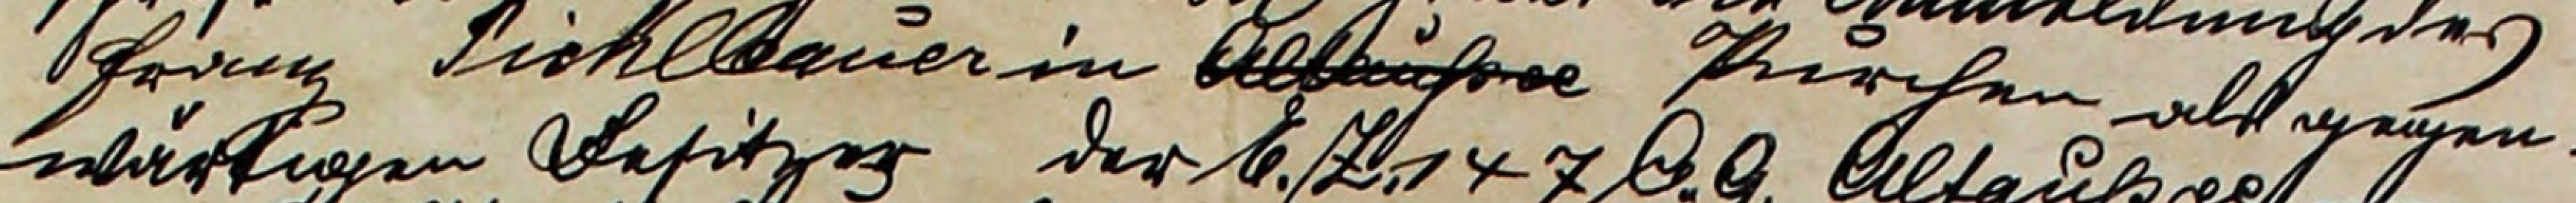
Franz Pichlbauer in Purchen als gegen.
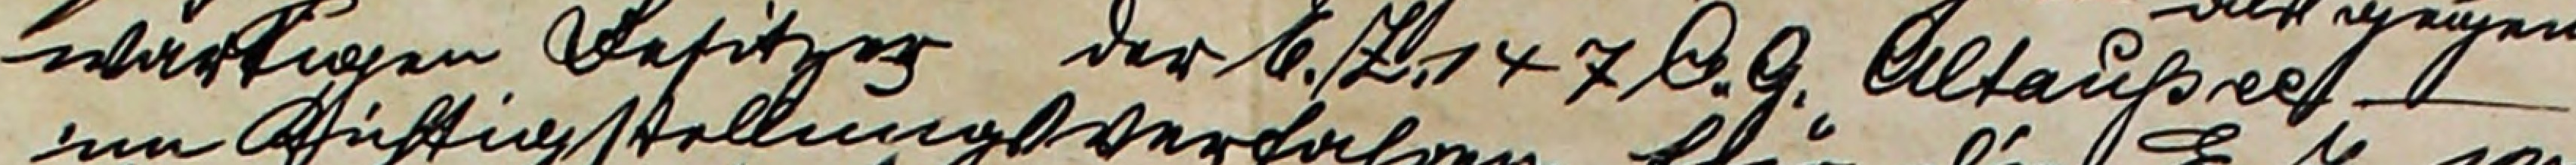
würtigen Besitzer der 6. Z. 147 O. G. Altaußee —
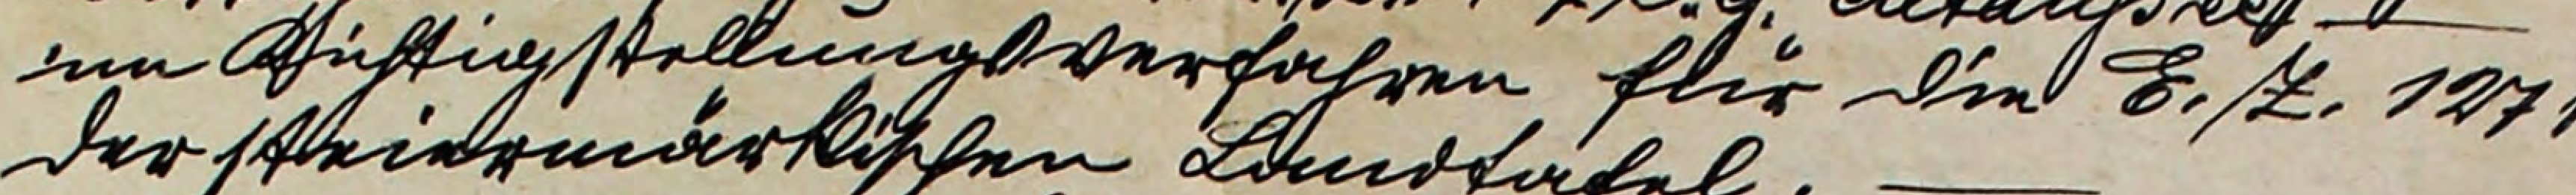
im Richtigstellungsverfahren für die E.Z. 1271
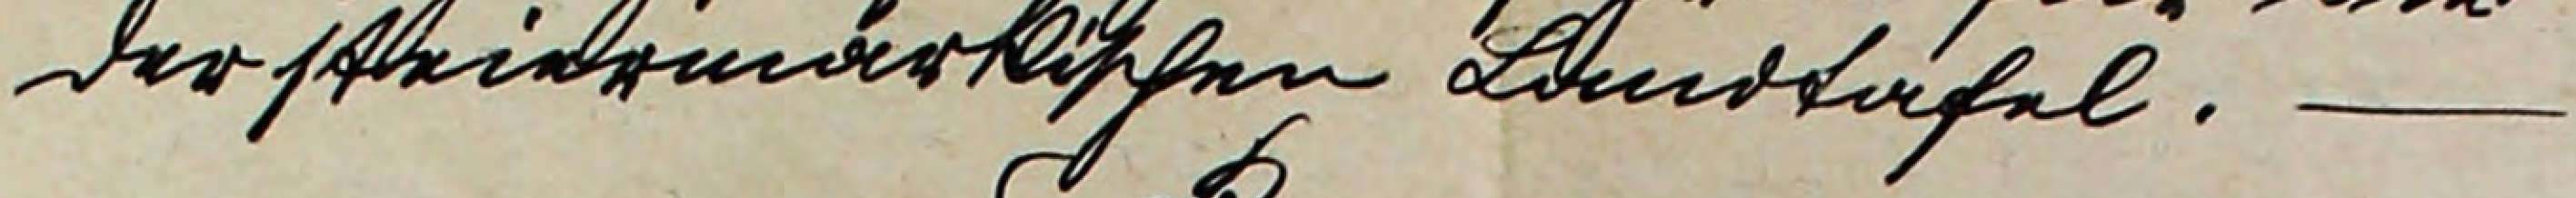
der steiermärkischen Landtafel. —
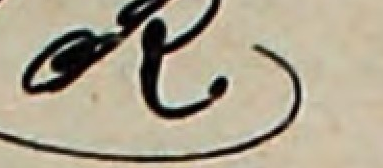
R
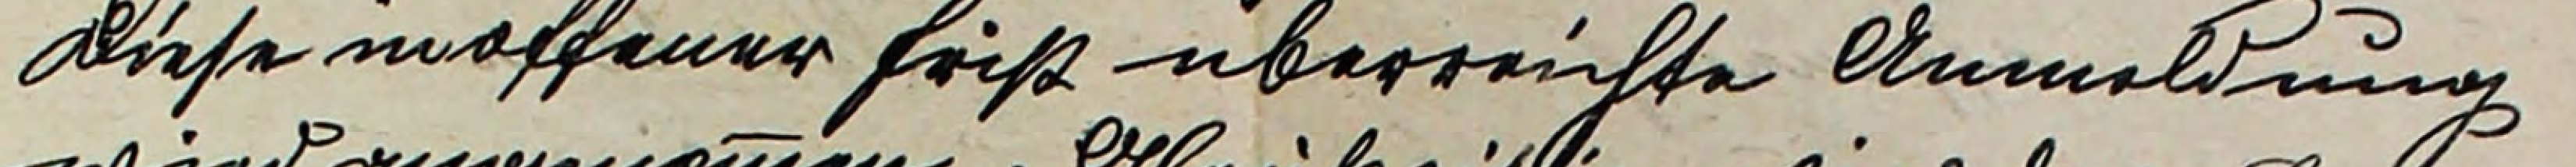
Diese in offener Frist überreichte Anmeldung
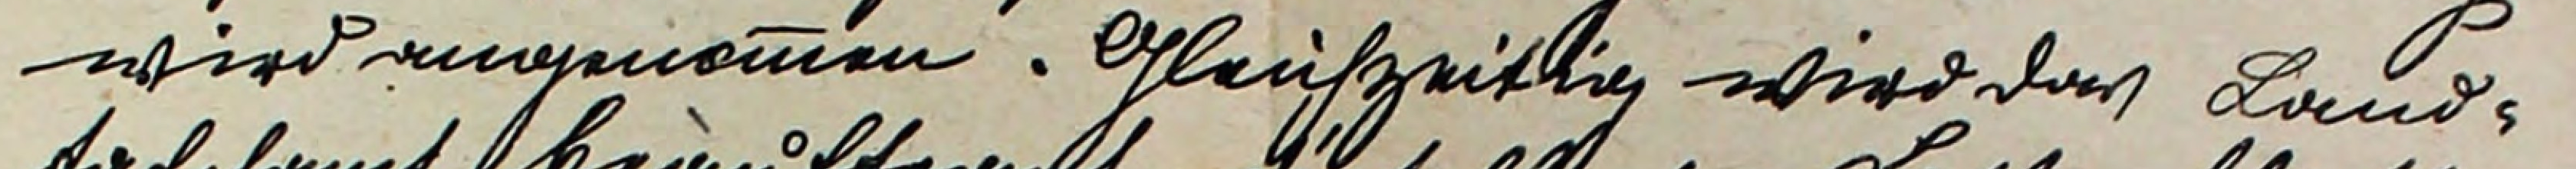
wird angenommen. Gleichzeitig wird das Land„
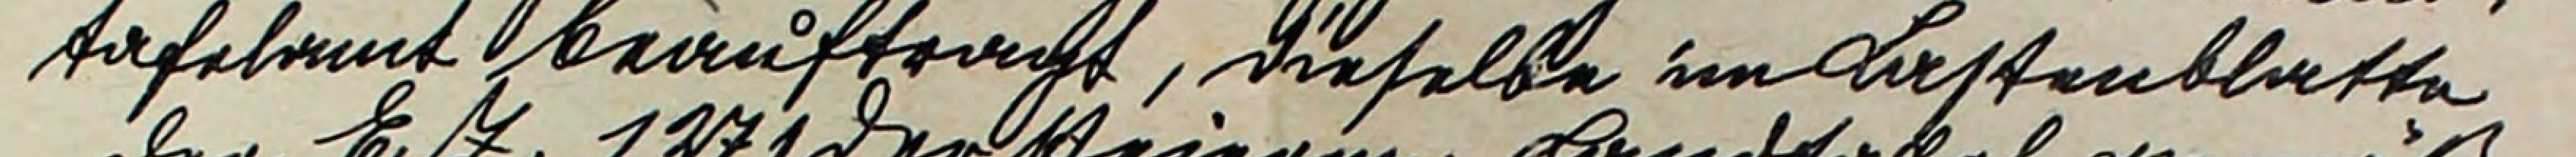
tafelamt beauftragt, dieselbe im Lastenblatte
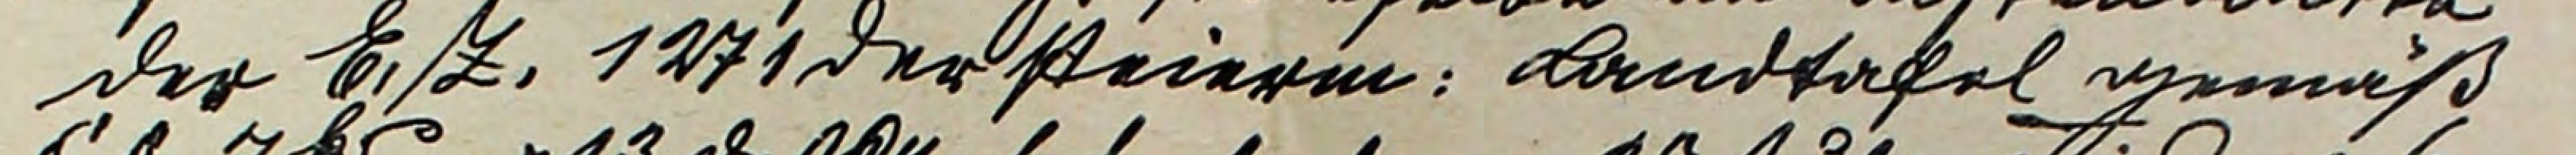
der E. Z. 1271 der steierm: Landtafel gemäß
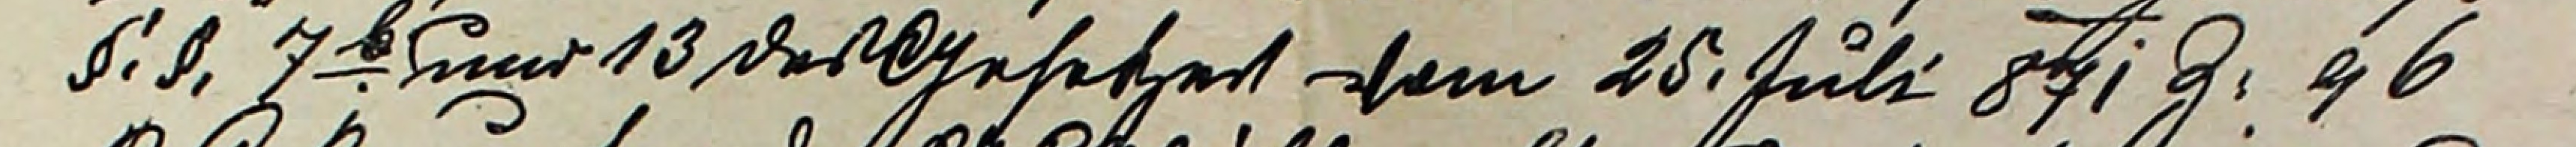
F.P. 7b und 13des Gesetzet vom 25. Juli 871 Z. 96
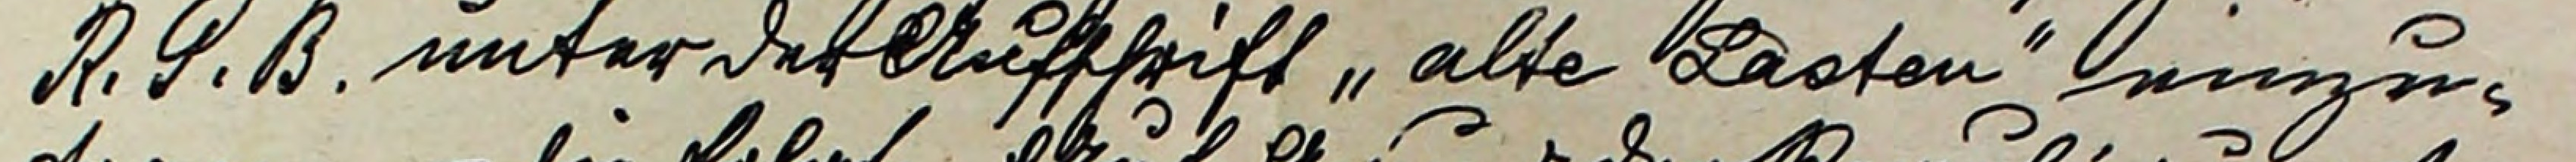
R.P.B. unter der Aufschrift „alte Lasten" einzu„
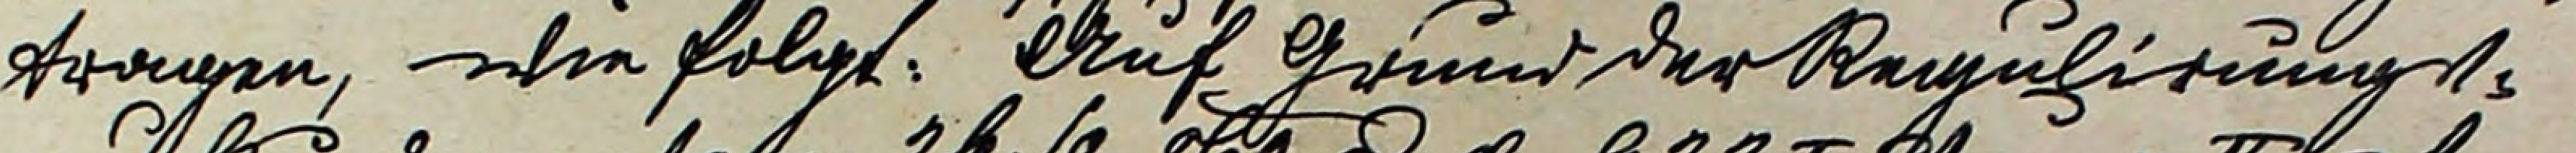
tragen, wie folgtÖ Auf Grund der Regulirungs„
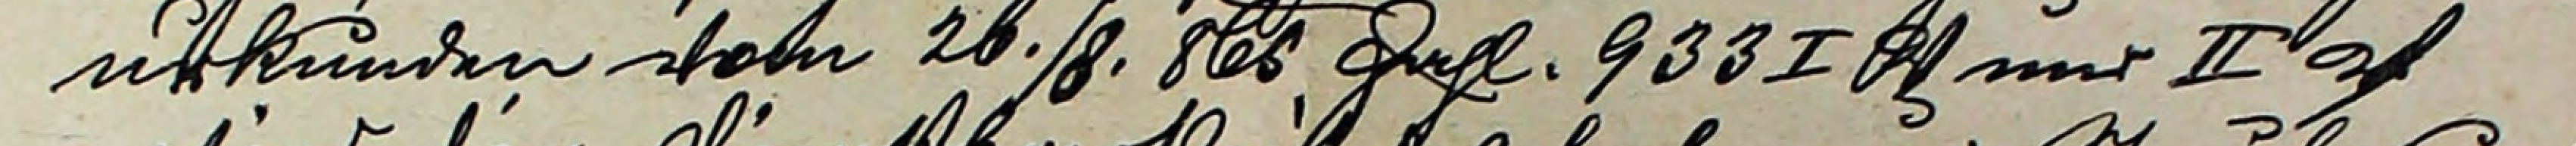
urkunden vom 26.-8. 866, Zahl. 933 I V und II V
